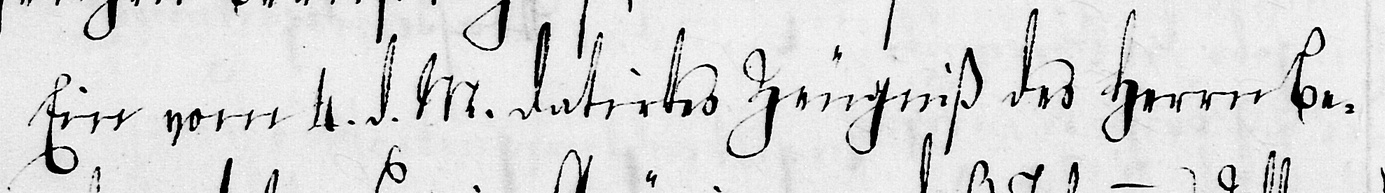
Ein vom 4. d. M. datirtes Zeugniß des Herrn Be¬
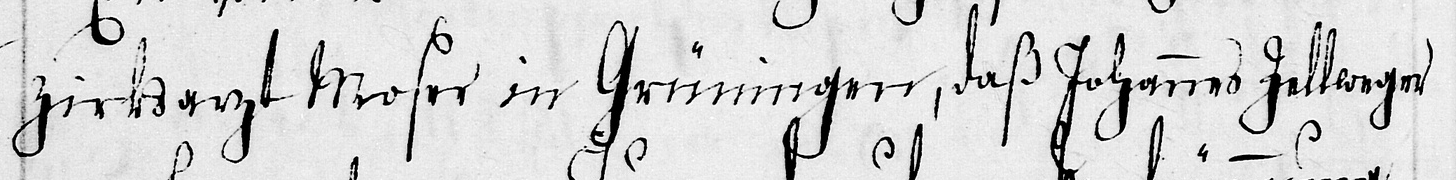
zirksarzt Moser in Grüningen, daß Johannes Zellweger
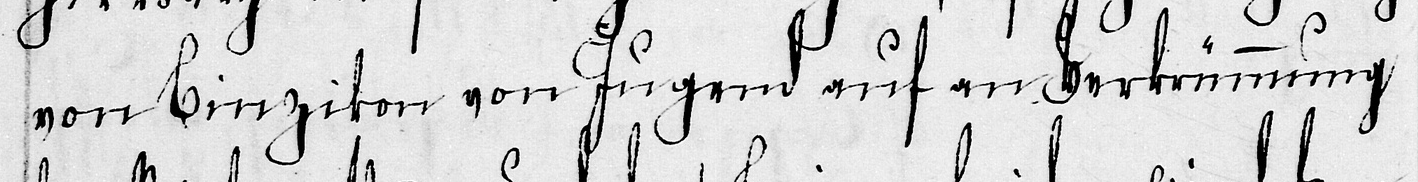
von Binzikon von Jugend auf an Verkrümmung
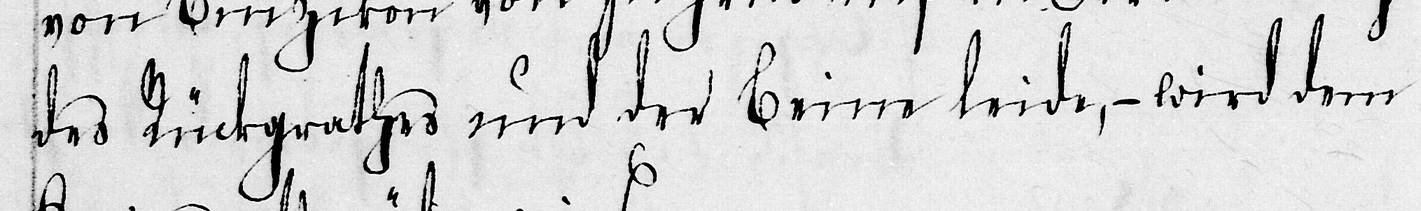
des Rückgrates und der Beine leide, – wird dem
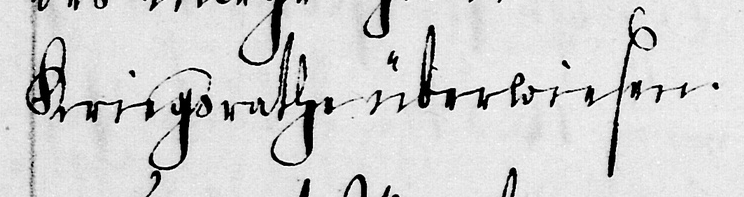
Kriegsrathe überwiesen.
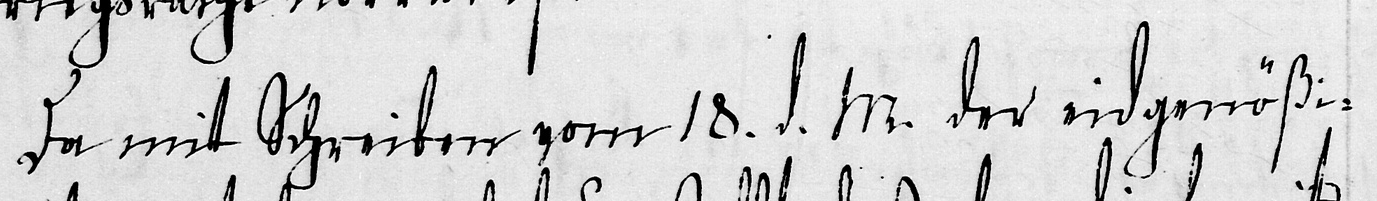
Da mit Schreiben vom 18. d. M. der eidgenößi¬
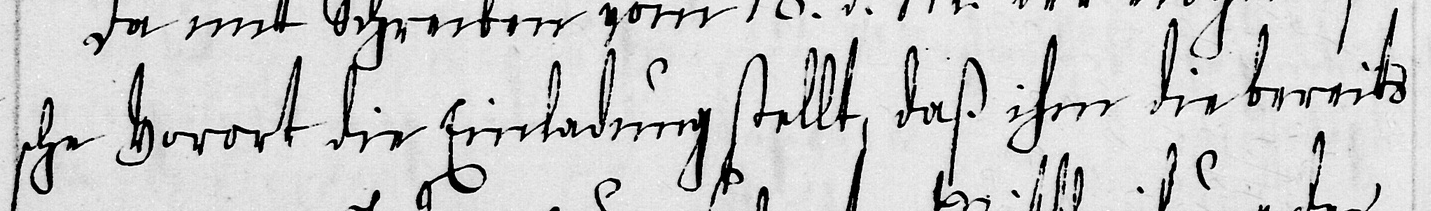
sche Vorort die Einladung stellt, daß ihm die bereits
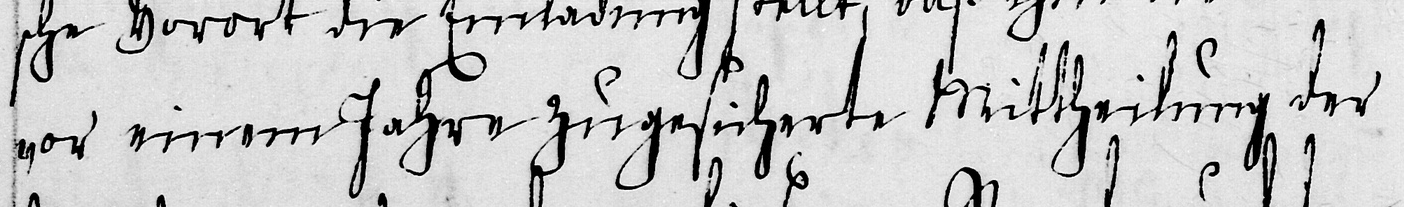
vor einem Jahre zugesicherte Mittheilung der
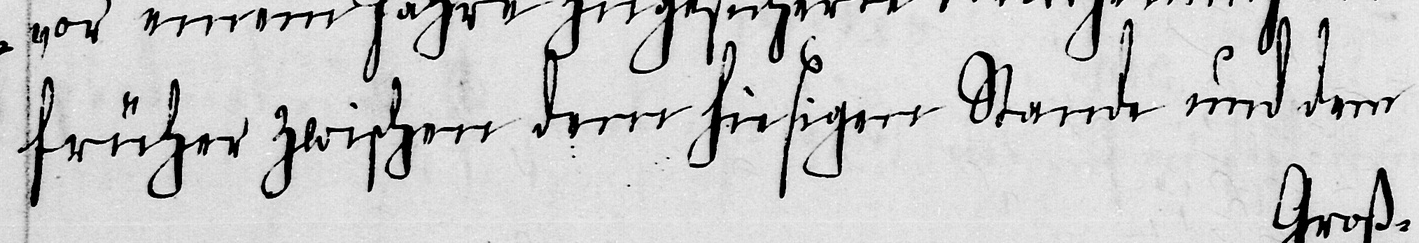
früher zwischen dem hiesigen Stande und dem
